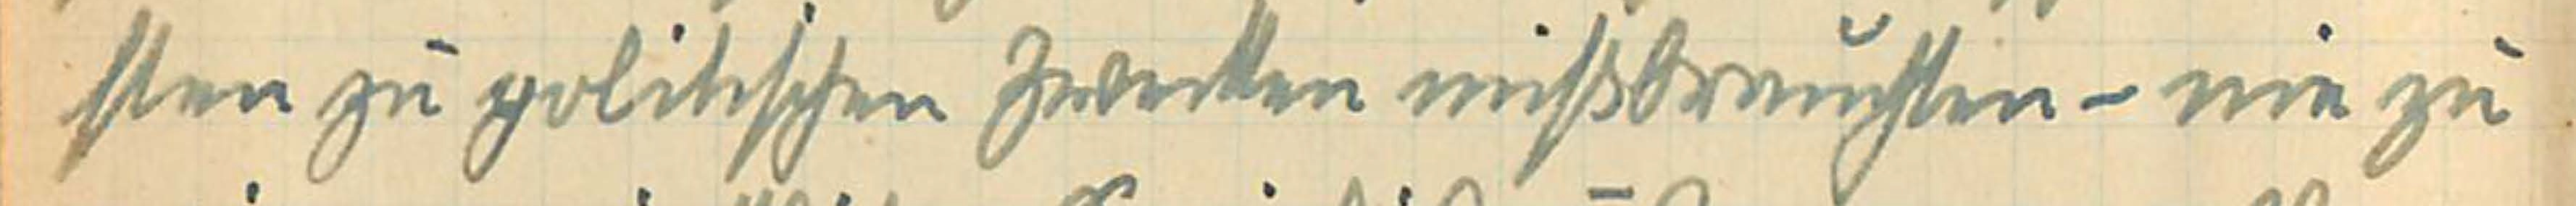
sten zu politischen Zwecken mißbrauchten – nie zu
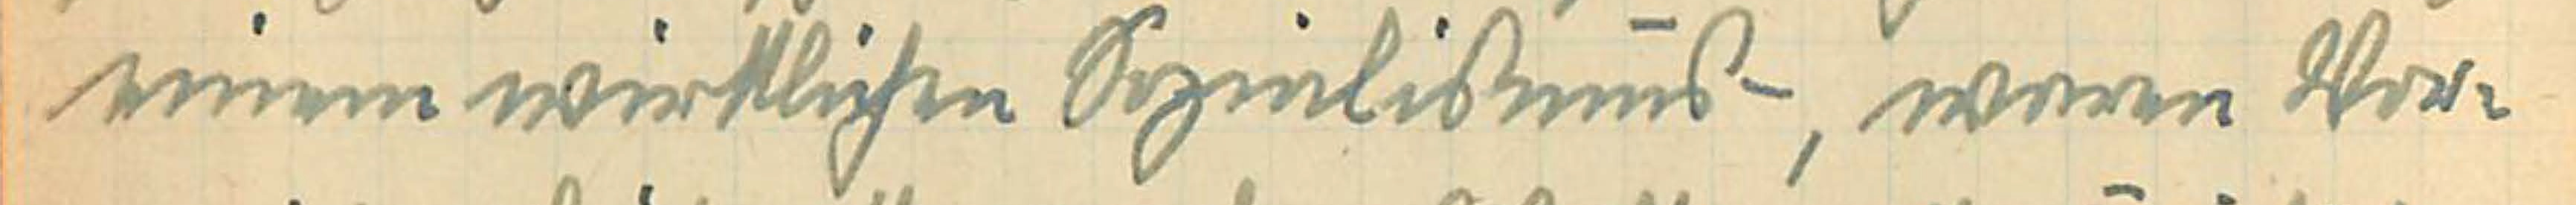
einem wirklichen Sozialismus –, waren Vor-
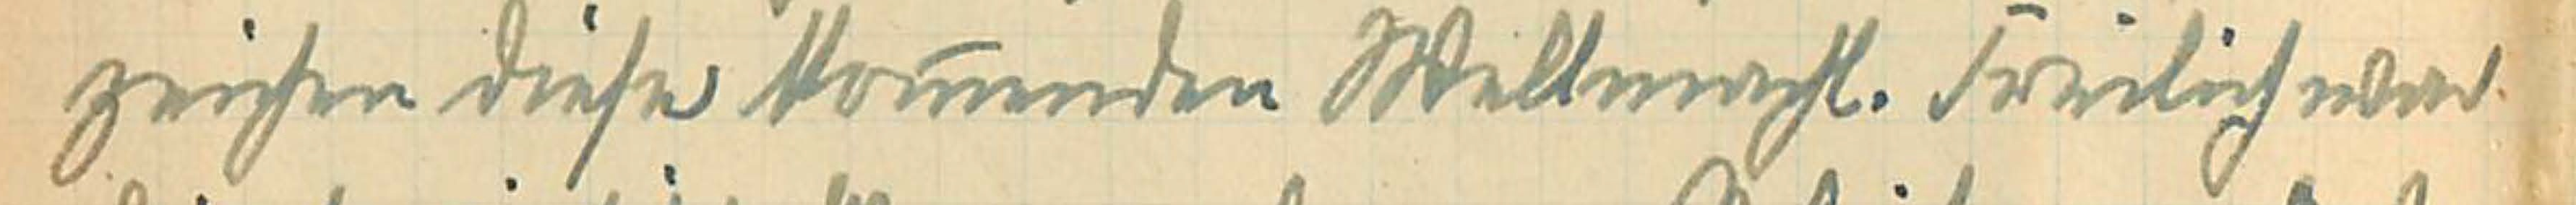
zeichen dieser kommenden Weltmacht. Freilich war
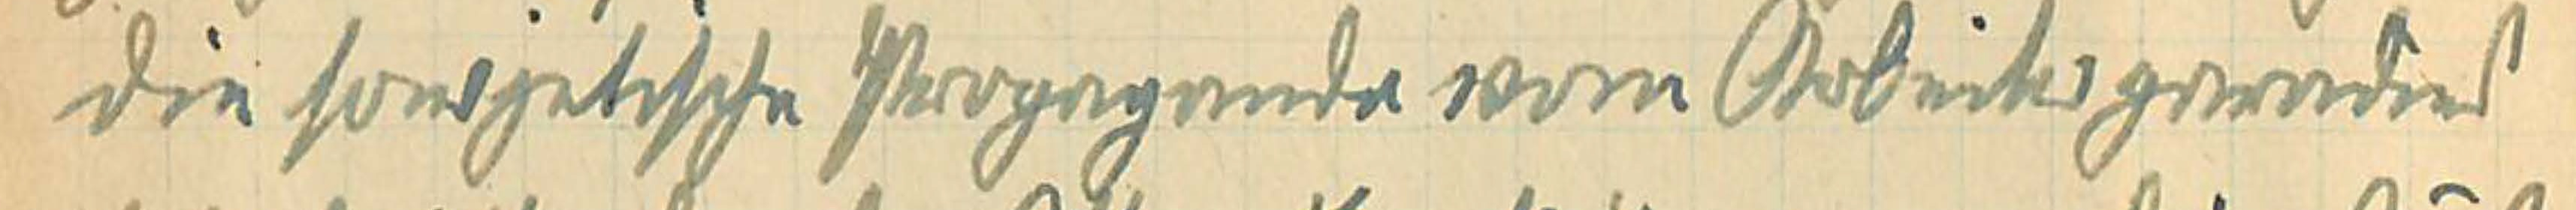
die sowjetische Propaganda vom Arbeiterparadies
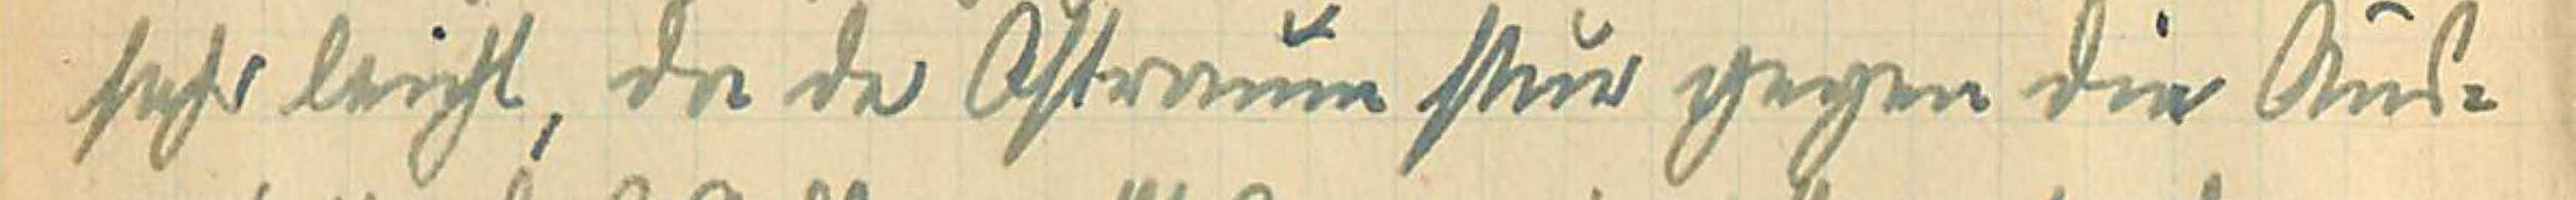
sehr leicht, da der Ostraum stur gegen die Aus-
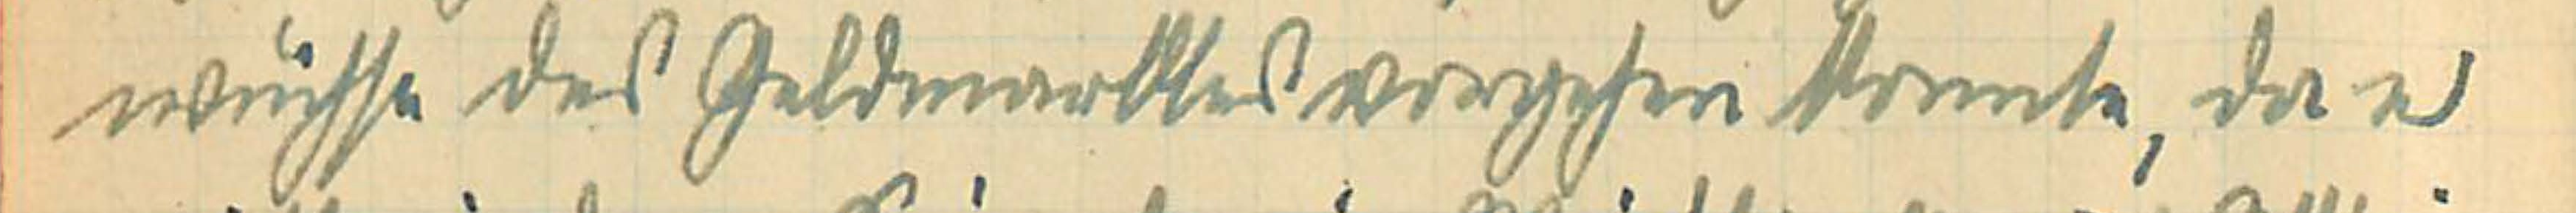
wüchse des Geldmarktes vorgehen konnte, da er
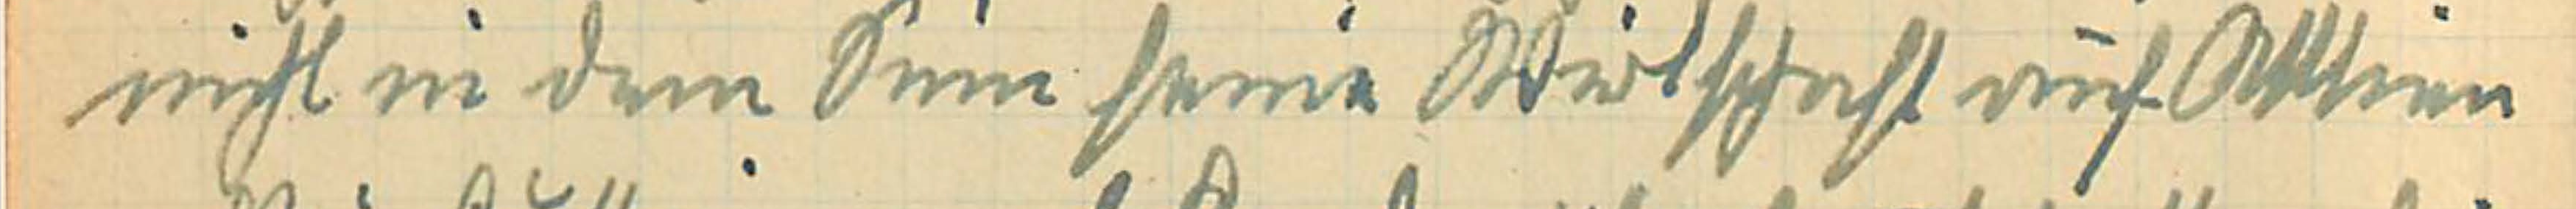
nicht in dem Sinn seine Wirtschaft auf Aktien
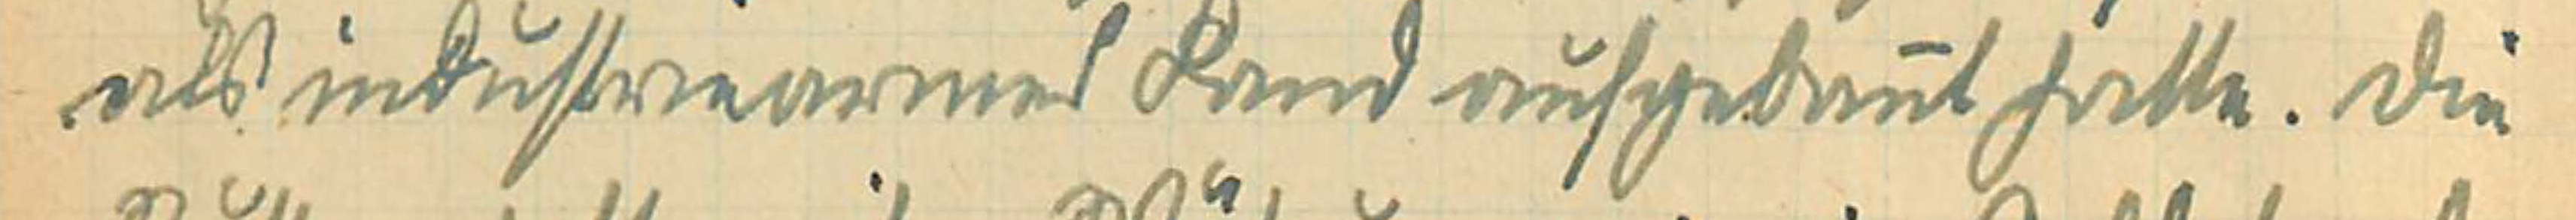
als industriearmes Land aufgebaut hatte. Die
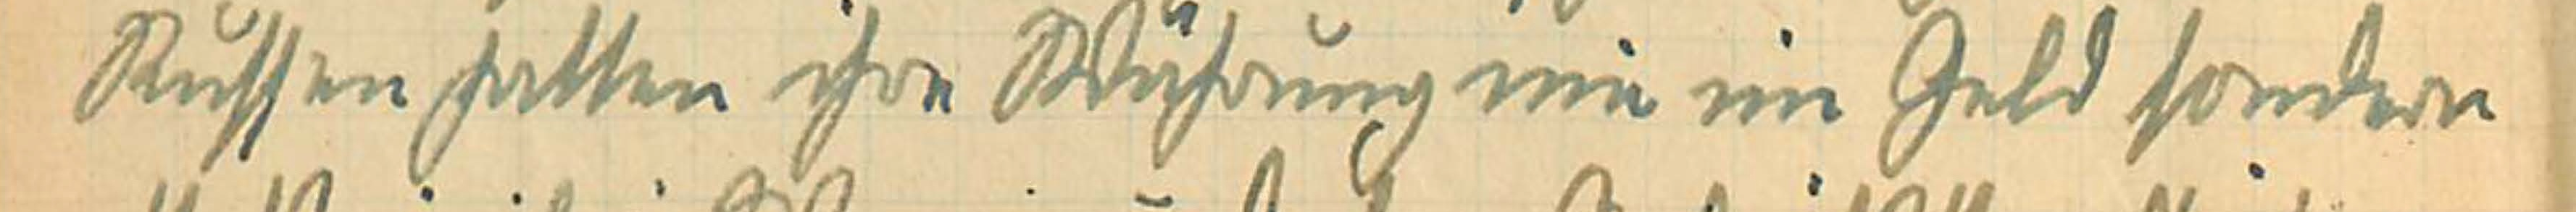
Russen hatten ihre Währung nie im Geld sondern
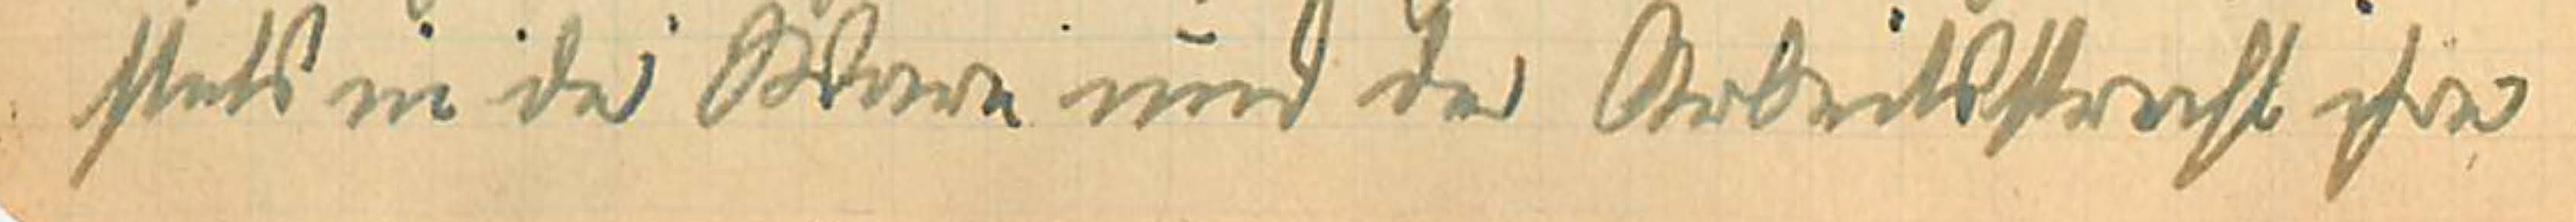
stets in der Ware und der Arbeitskraft ihrer
